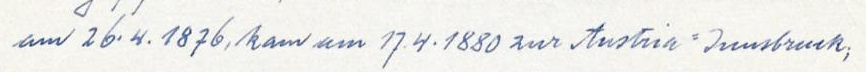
am 26. 4. 1876, kam am 17.4.1880 zur Austria-Innsbruck;
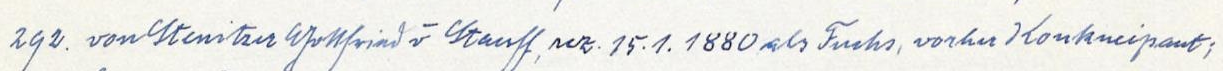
292. von Stemitzer Gottfried v/0 Stauff, rez. 15.1. 1880 als Fuchs, vorher Konkneipant;
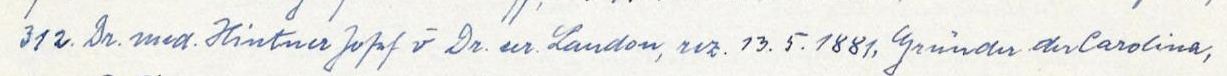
312. Dr med. Hintner Josef v/o Dr. cer. Landon, rez. 13. 5. 1881, Gründer der Carolina,
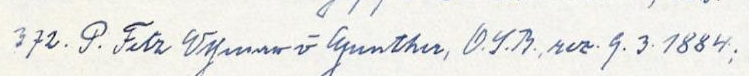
372 P. Fritz Othmar v/o Gunther, OSB rez 9.3.1884;
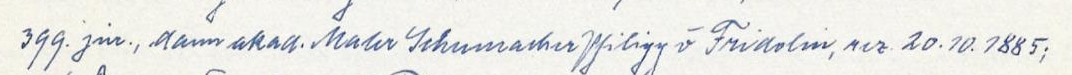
399. iur., dann akad. Maler Schumacher Philipp v/o Fridolin, rez. 20.101885;
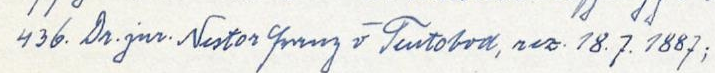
436. Dr. jur. Nestor Franz v/o Teutobra, rez. 18. 7. 1887;
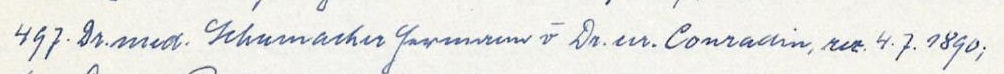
497. Dr. med. Schumaher Hermann v/o Dr. cer. Conradus, rez. 4.7. 1890;
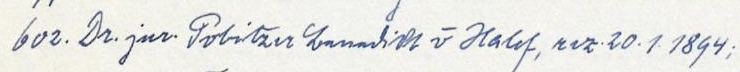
602. Dr. jur. Pobitzer Benedikt v/o Halof, rez. 20. 1. 1894;
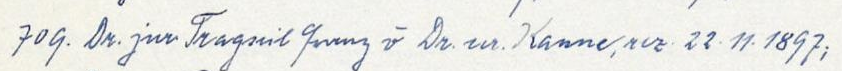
709. Dr. jur. Tragseil Franz v/o Dr. cer. Kanne, rez 22. 11. 1897;
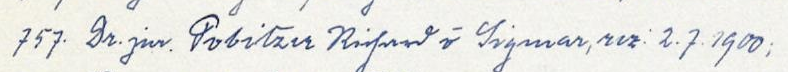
757 Dr. jur. Pobitzer Richard v/o Sigmar, rez 2. 7. 1900;
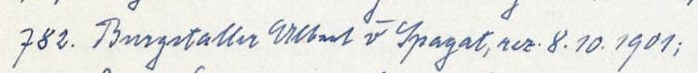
782. Burgstaller Albert v/o Spagat; rez. 8. 10. 1901;
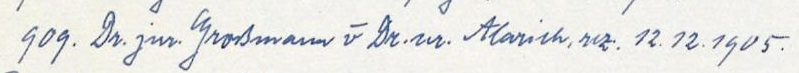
909. Dr. jur Großmann v/o Dr. iur. Alarich, rez. 12. 12. 1905.
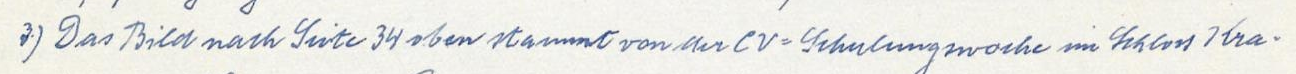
7) Das Bild auf Seite 34 oben stammt von der CV-Schulungswoche im Schloss Kra-
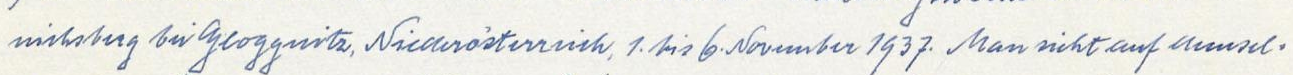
nichsberg bei Gloggnitz, Niederösterreich, 1 bis 6. November 1937. Man sieht auf demsel-
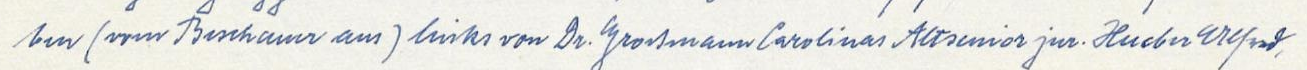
ben (vom Beschauer aus) links von Dr. Großmann Carolinas Altsenior jur. Hucher Alfred,
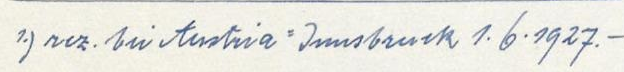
1) rez. bei Austria- Innsbruck 1.6.1927.-
